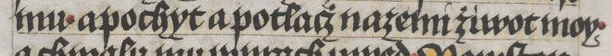mu.a pochyt a potlacż nazemi żiwot moy.
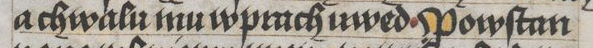a chwalu mu w prach uwed.Powſtan
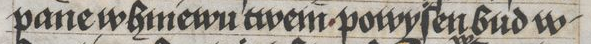pane whniíewu twem.powyẛen bud w¬
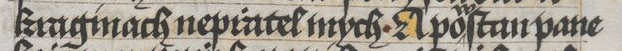kraginach nepṙatel mych.A powſtan pane
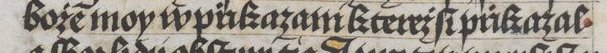boże moy w pṙikazani ktereż ſi pṙikazal.
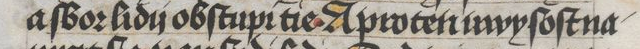a ſbor lidij obſtupi tie.A pro ten uwyſoſt na¬
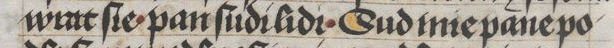wrat ſie.pan ſudí lidi.Bud mie pane po¬
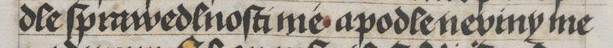dle ſprawedlnoſti mé.a podle neviny me
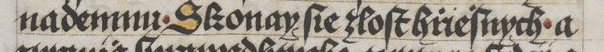nade mnu.Skonay ſie zloſt hřieẛnych.a
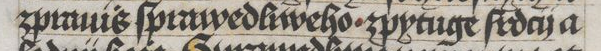zpravíṡ ſprawedliweho.zpytuge ſrdcij a
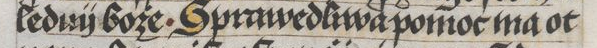ledvij boṡe.Sprawedliwa pomoc ma ot¬
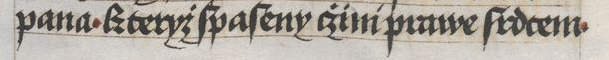pana.kteryṡ ſpaſeny cṡiní prawe ſrdcem.
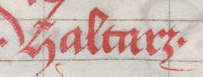.Zaltarz.
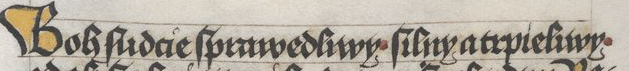Boh ſudcie ſprawedliwy.ſilny a trpieliwy.
